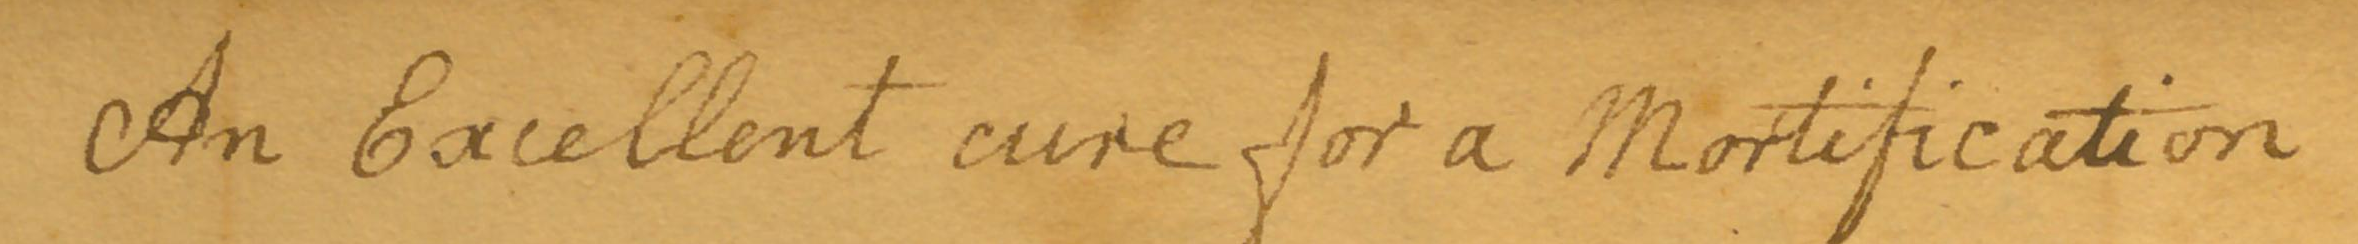An Excellent cure for a Mortification
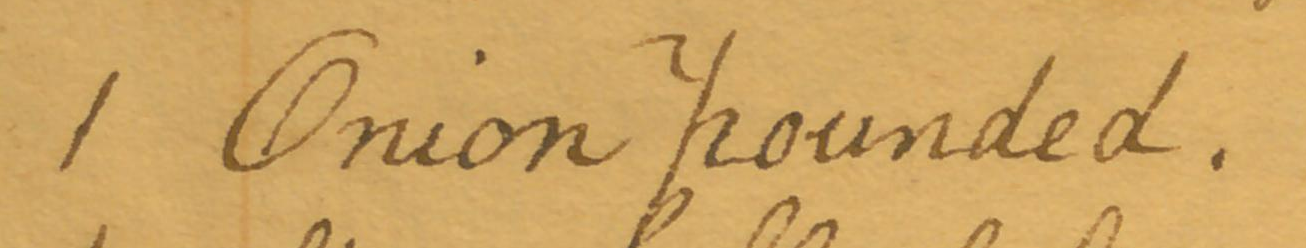1 Onion pounded.
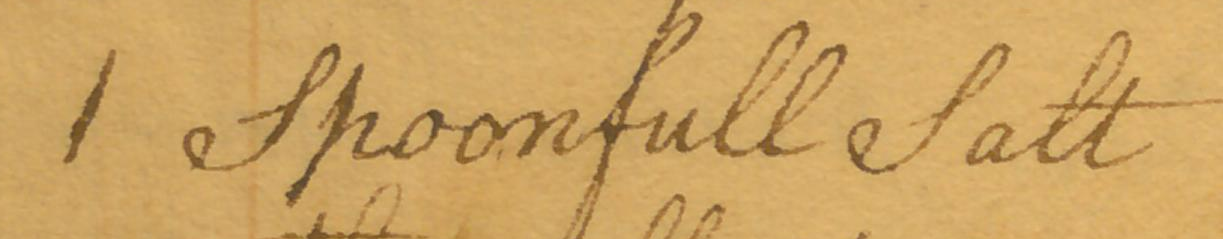1 spoonfull salt
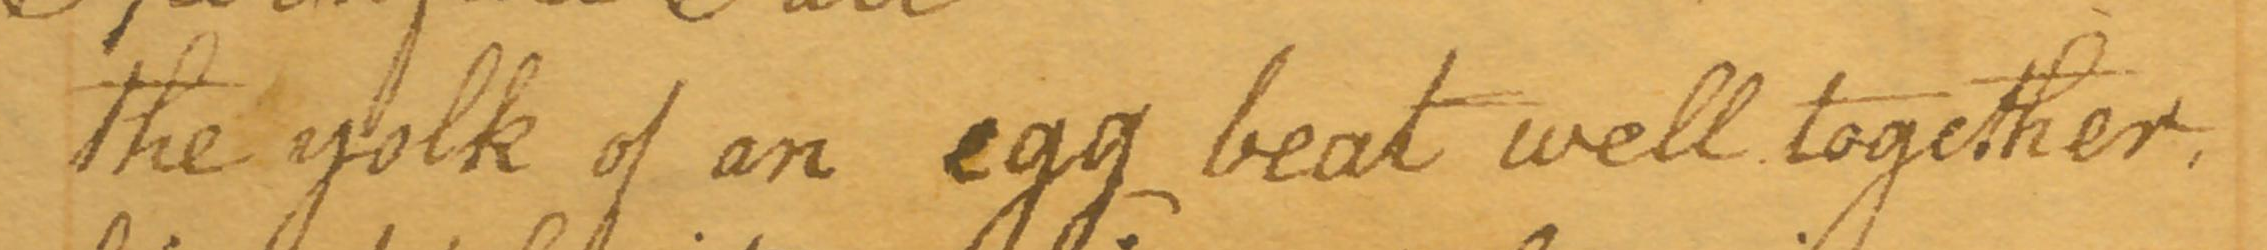the yolk of an egg beat well together
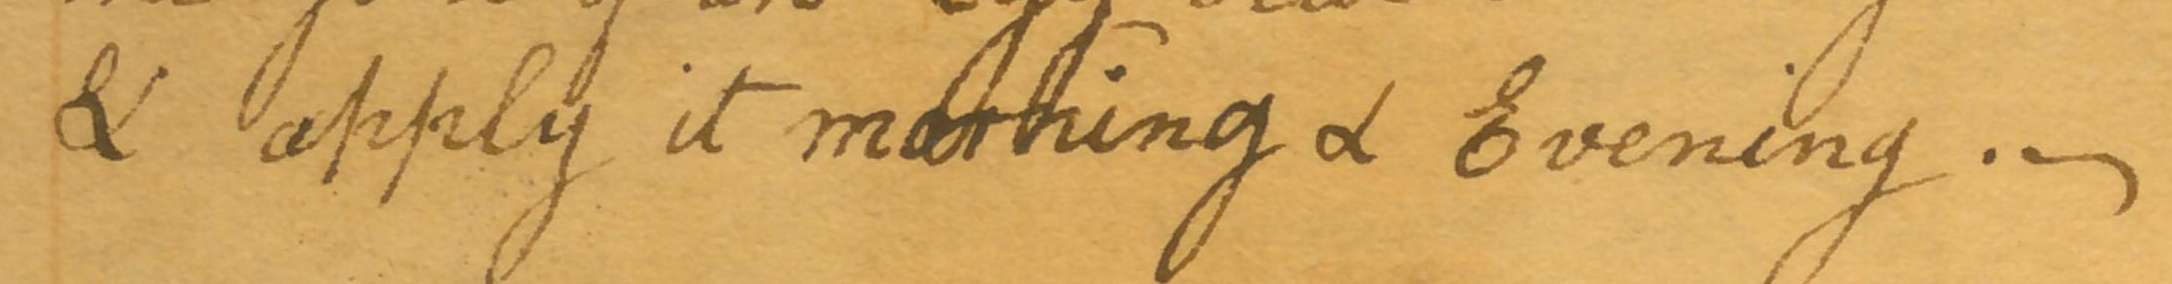& apply it morning & Evening.-
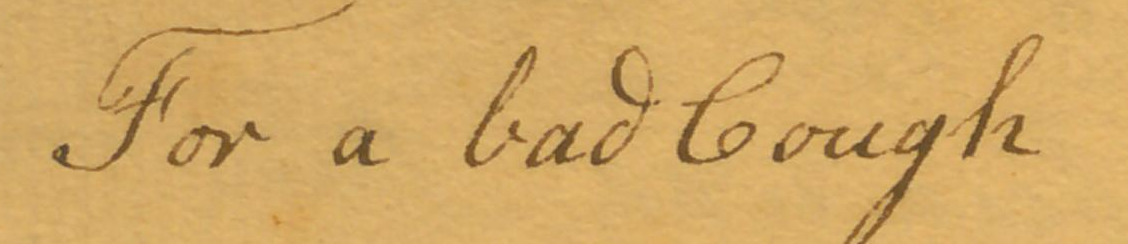For a bad Cough
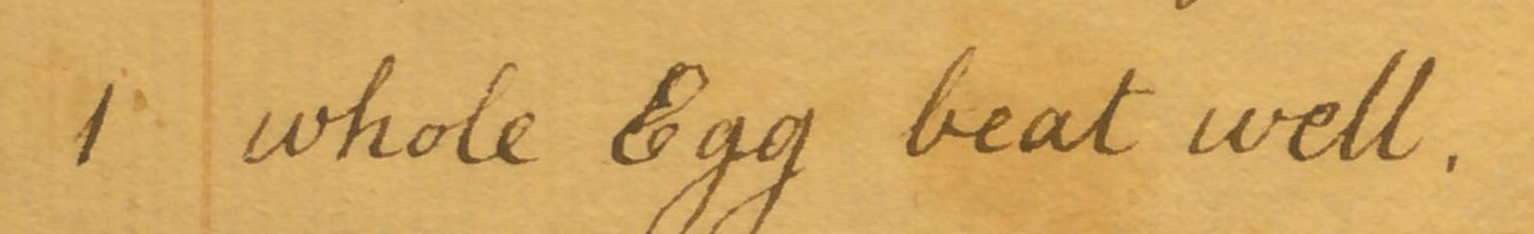1 whole Egg beat well.
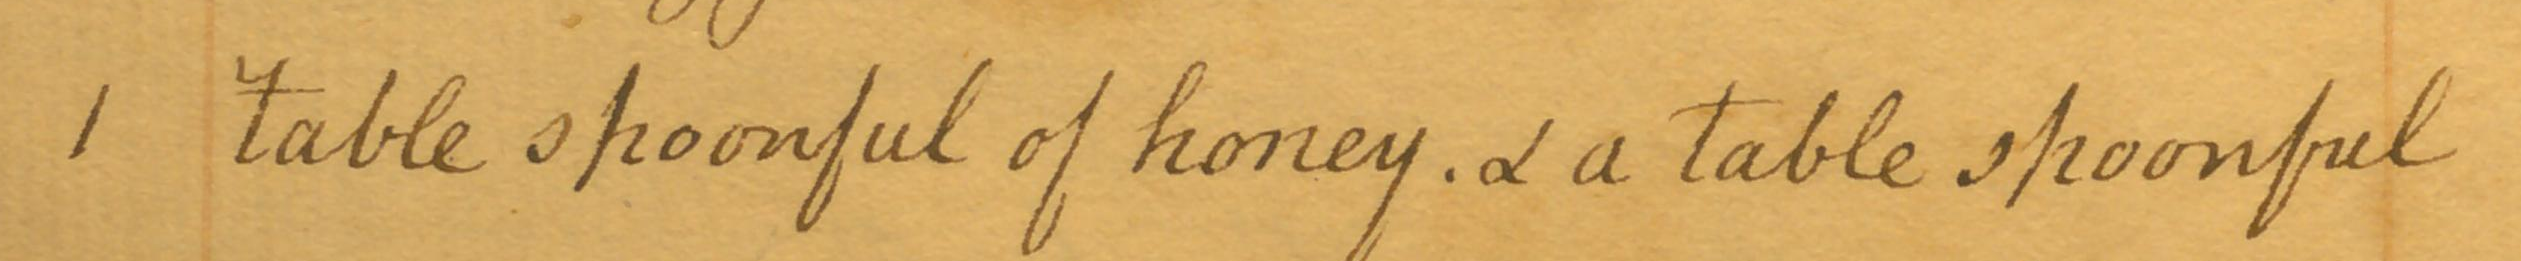1 table spoonful of honey. & a table spoonful
